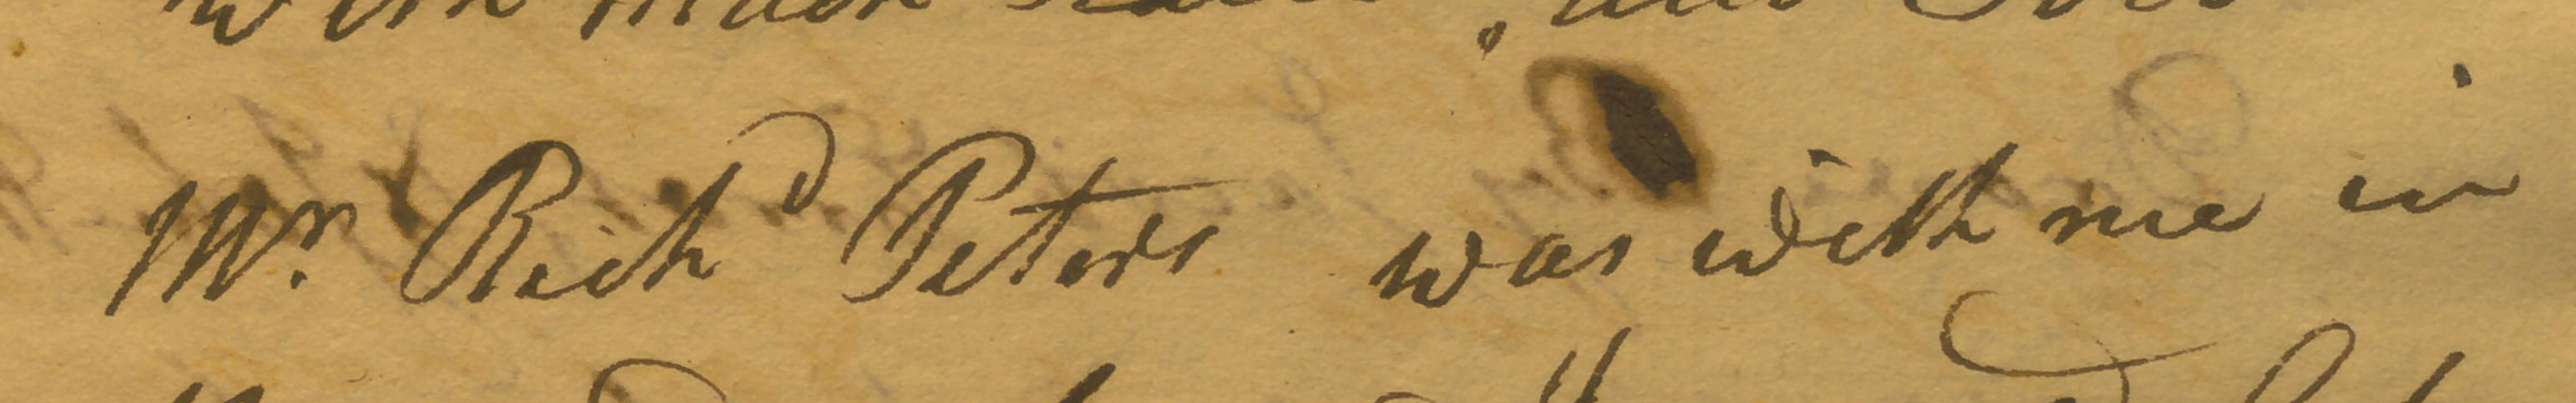M^r. Rich^d Peters was with me in
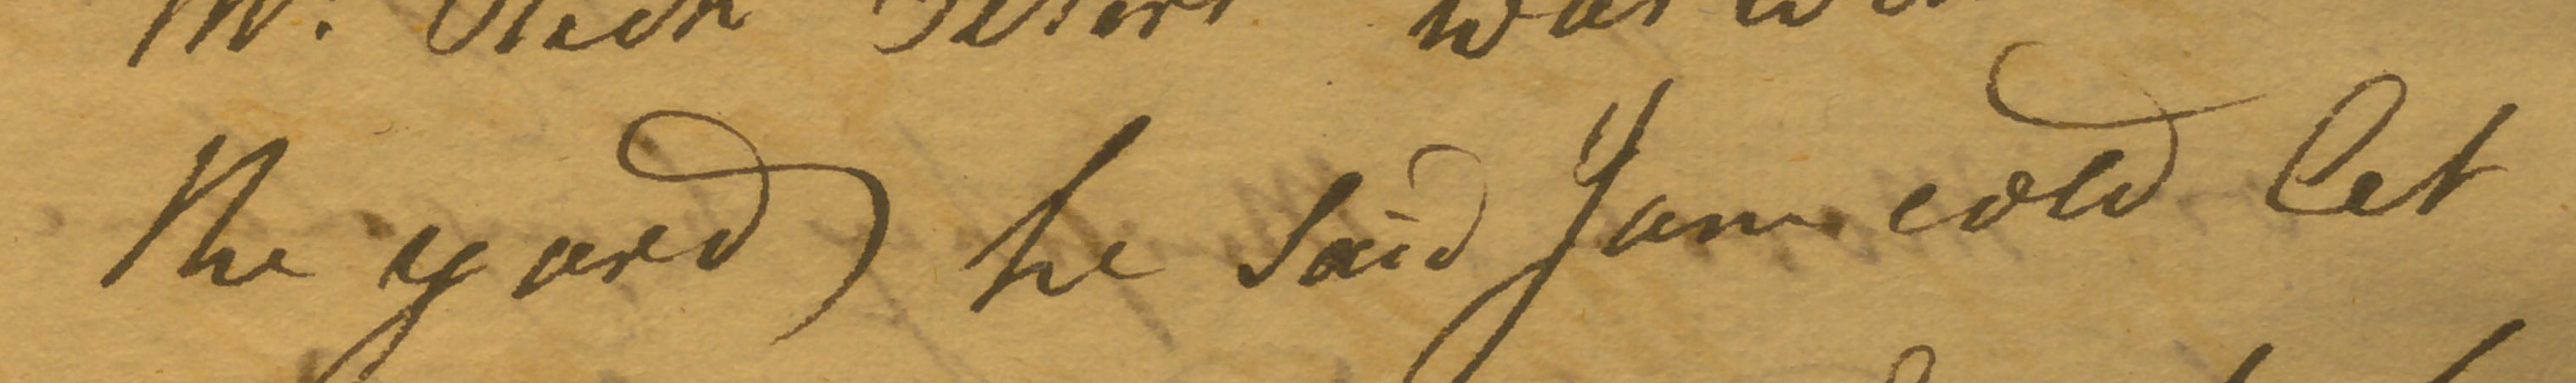the yard he said I am cold let
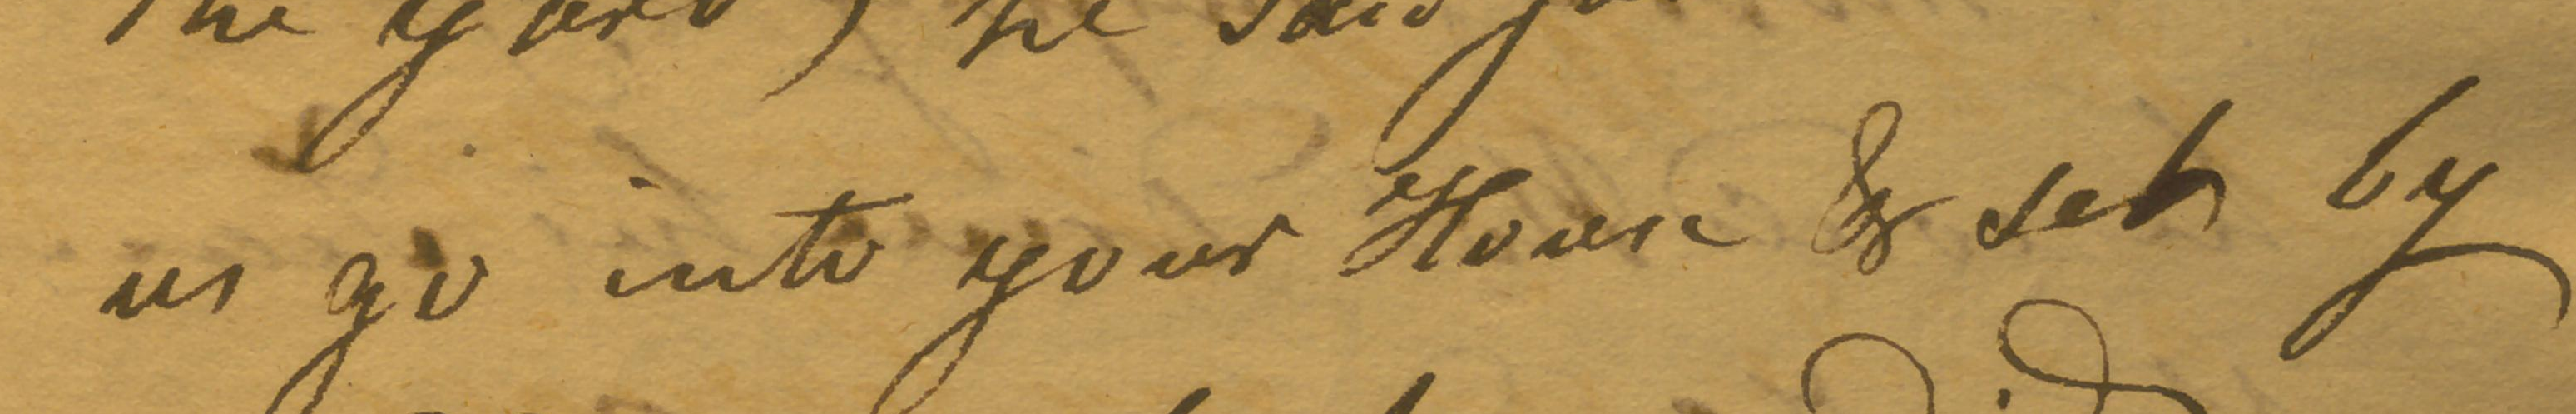us go into your House & set by
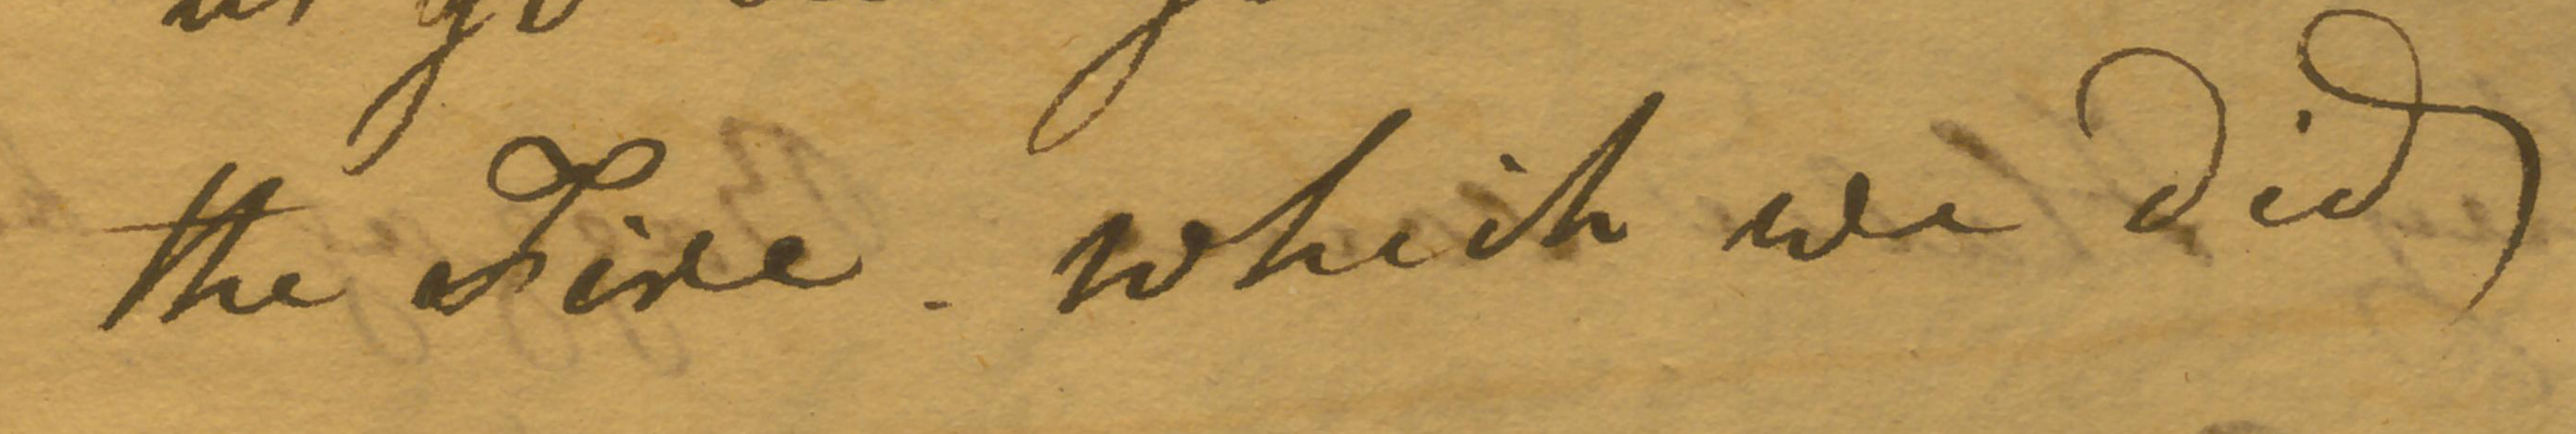the Fire, which we did
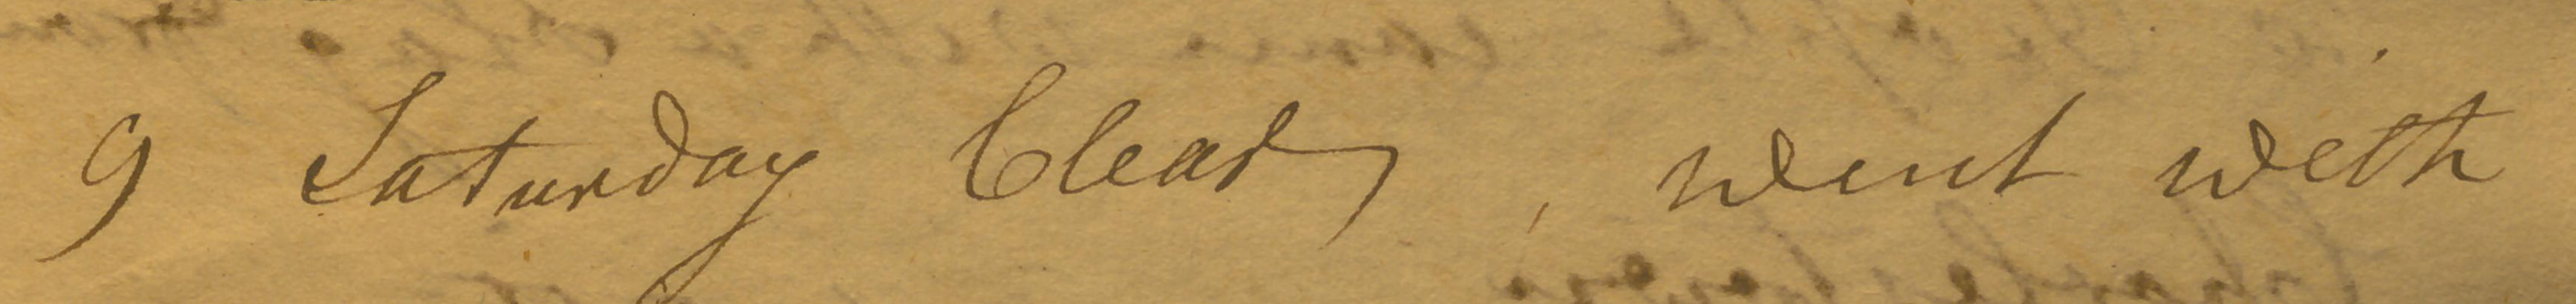9 Saturday Clear, went with
